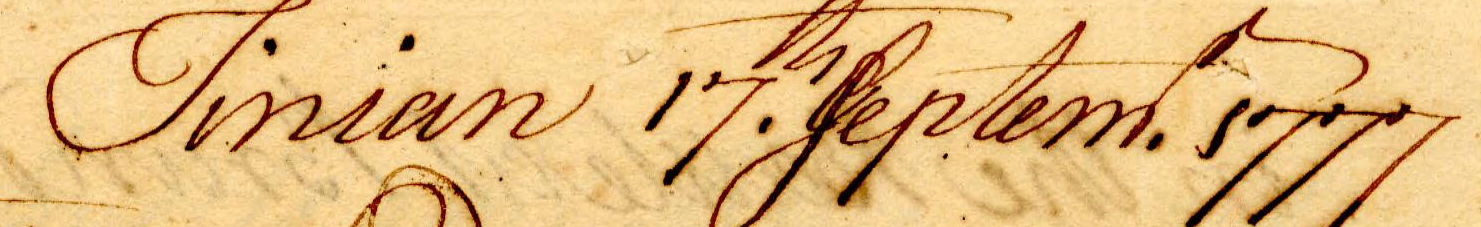Tinian 17. Septem^r. 1777
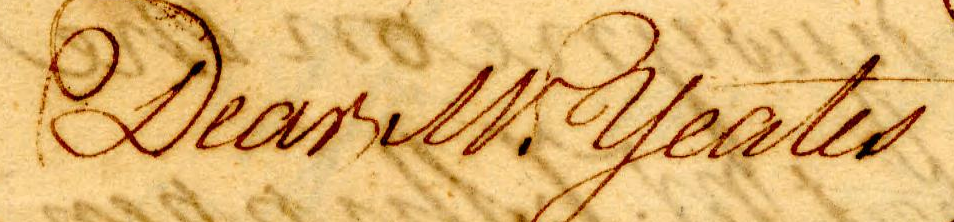Dear M^r. Yeates
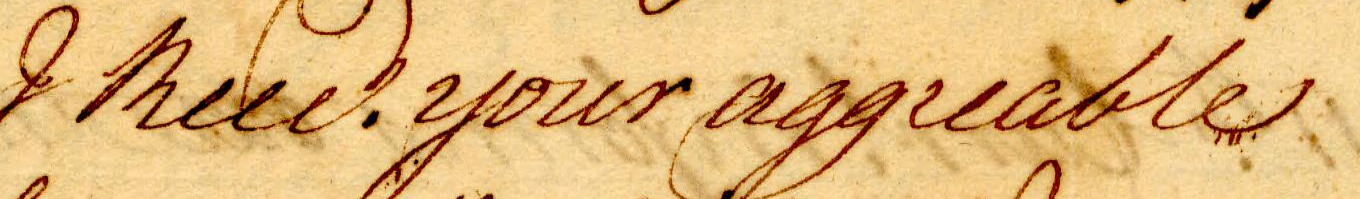I Rec^d. your aggreable
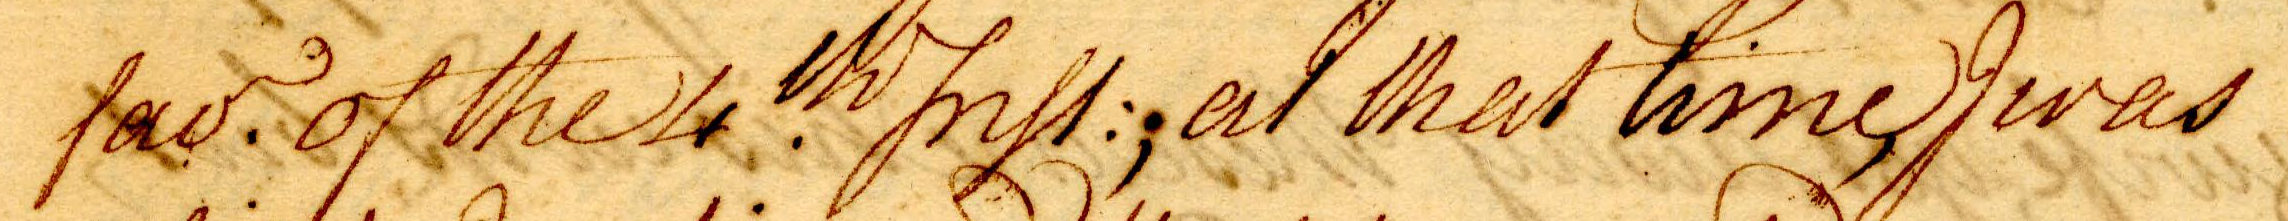fav. of the 4^th Inst:; at that time I was
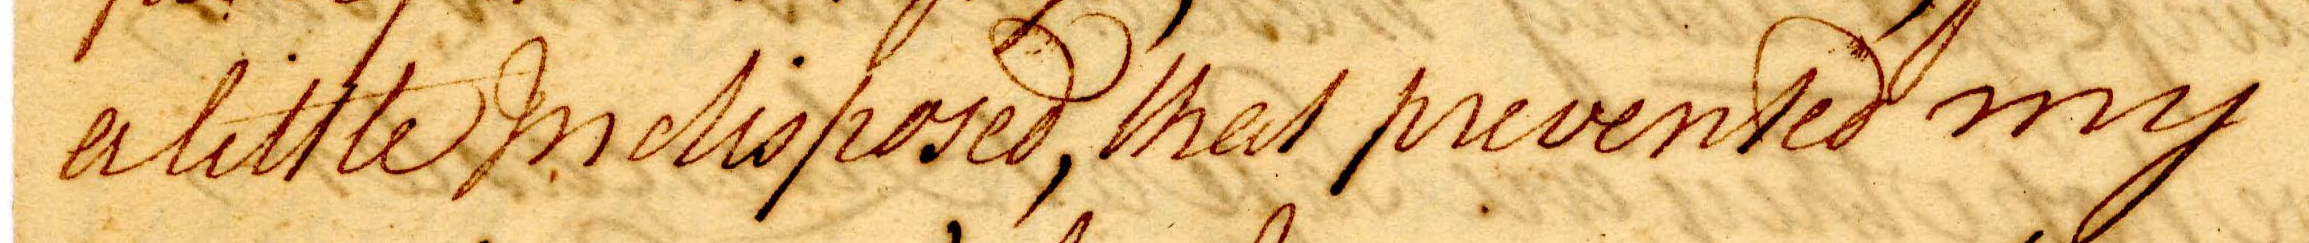a little Indisposed, that prevented my
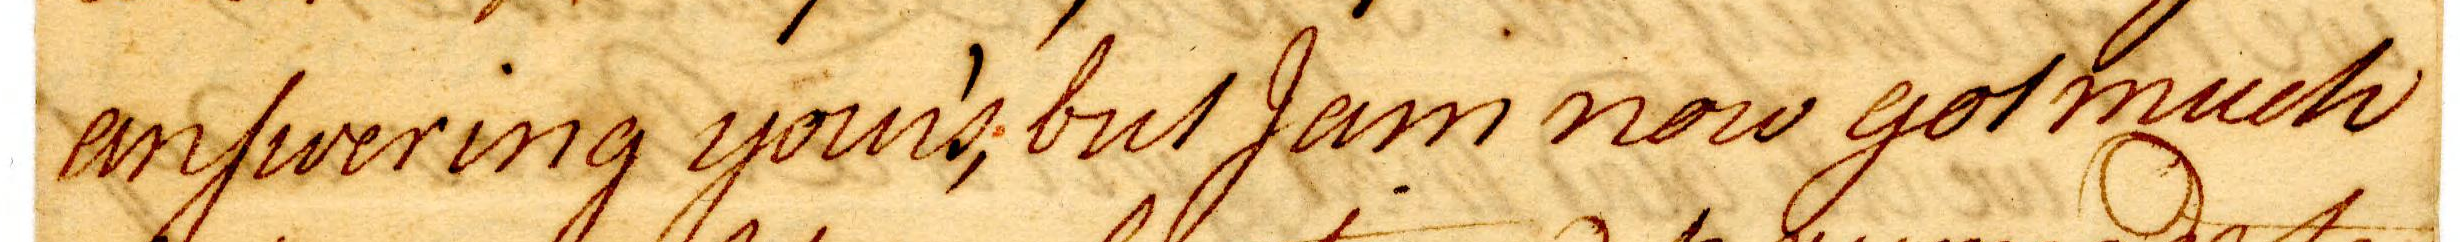answering your's, but I am now got much
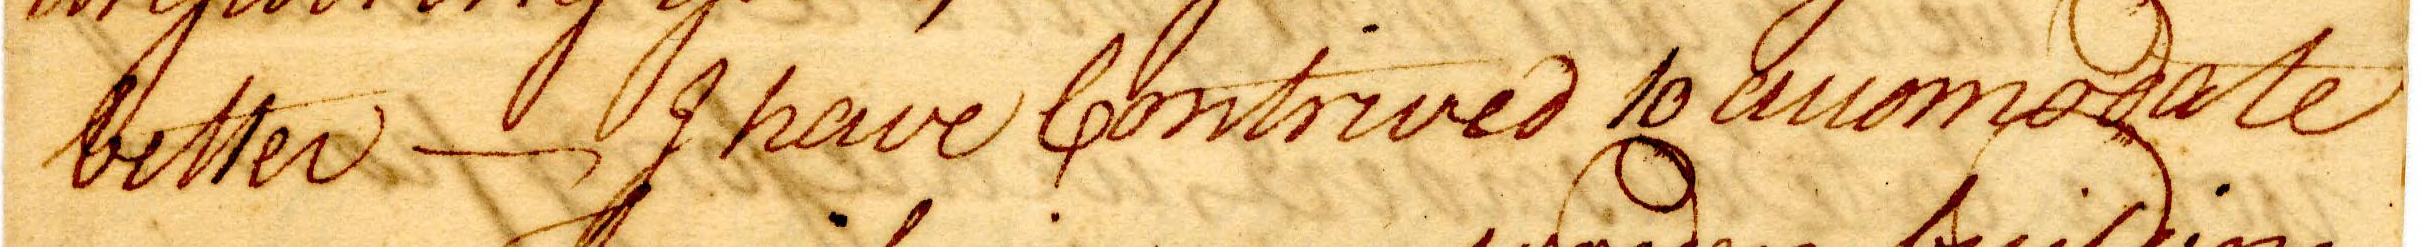better- I have Contrived to accomodate
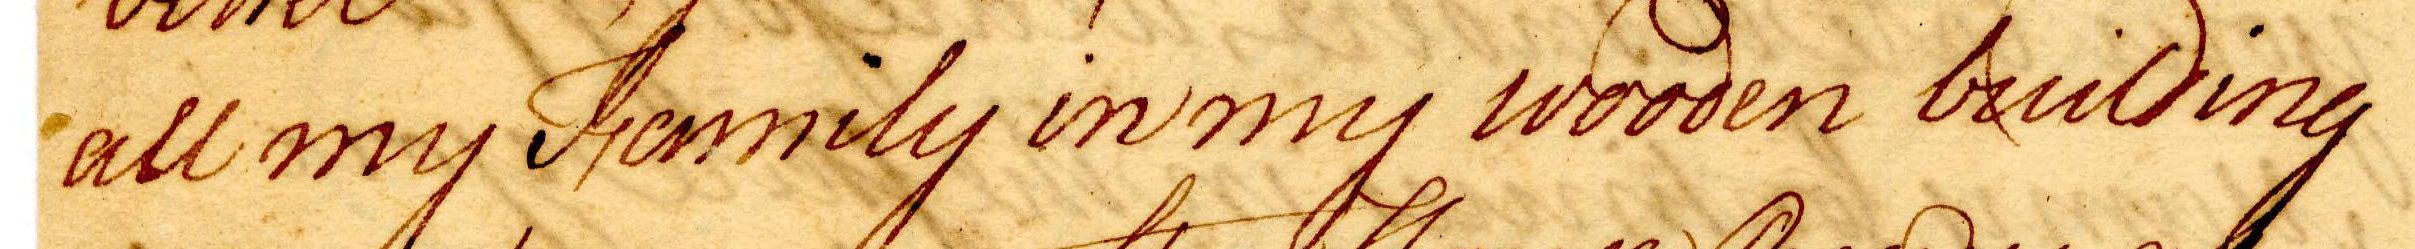all my Family in my wooden building
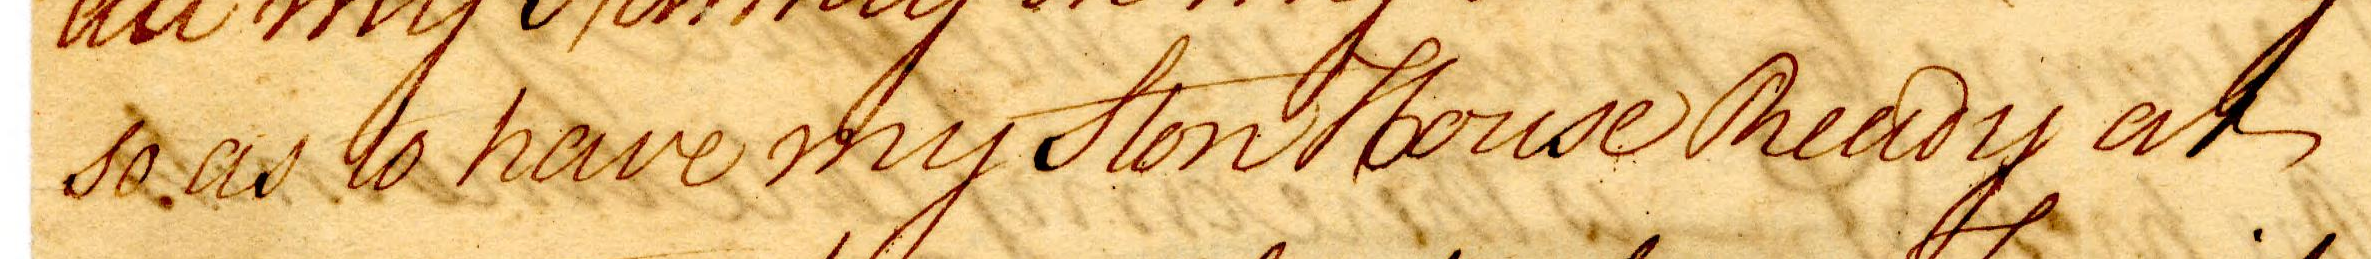so as to have my Ston House Ready at
